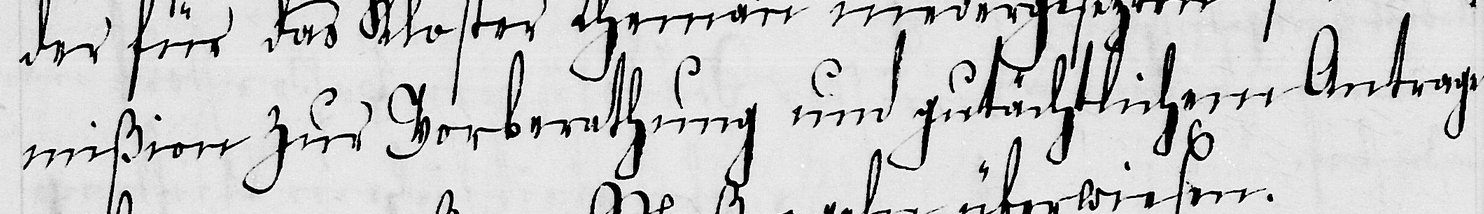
mmißion zur Vorberathung und gutächtlichem Antrage
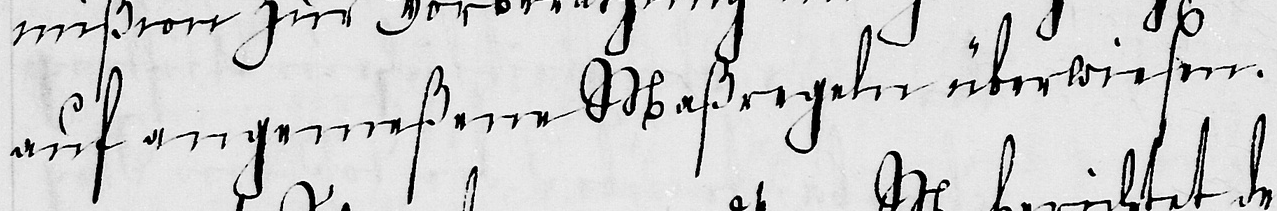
auf angemeßene Maßregeln überwiesen.
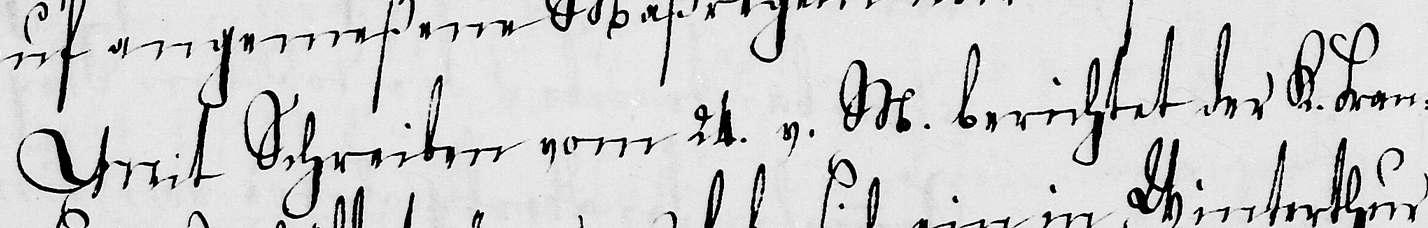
Mit Schreiben vom 24. v. M. berichtet der K. Fran¬
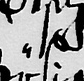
4. d.
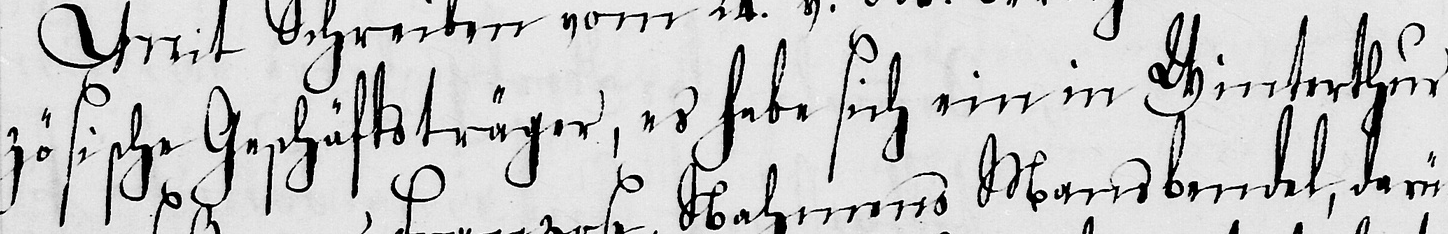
zösische Geschäftsträger, es habe sich ein in Winterthur
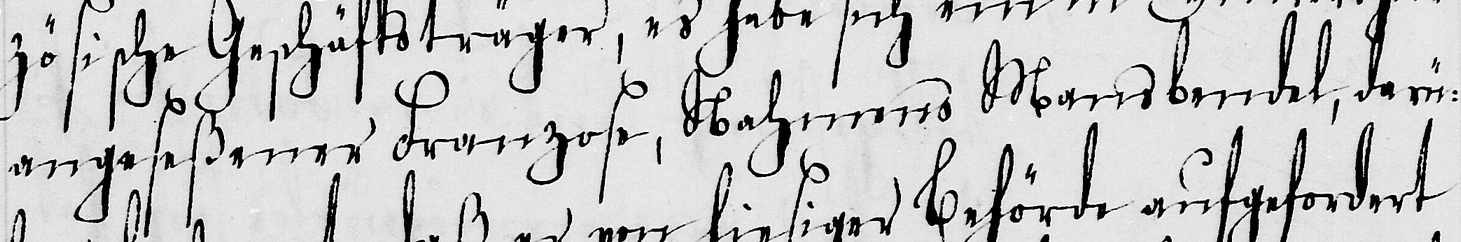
angeseßener Franzose, Nahmens Mansbendel, darü¬
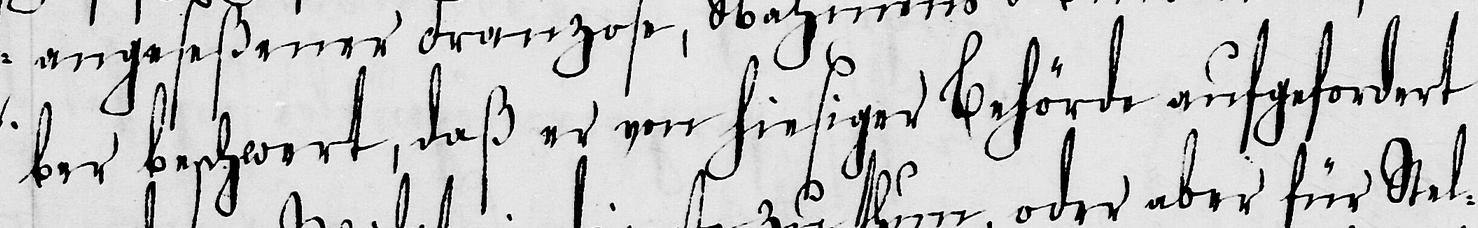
ber beschwert, daß er von hiesiger Behörde aufgefordert
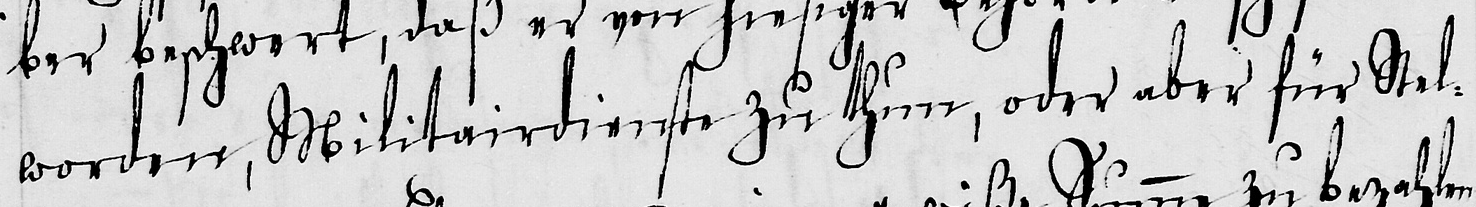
worden, Militairdienste zu thun, oder aber für Stel¬
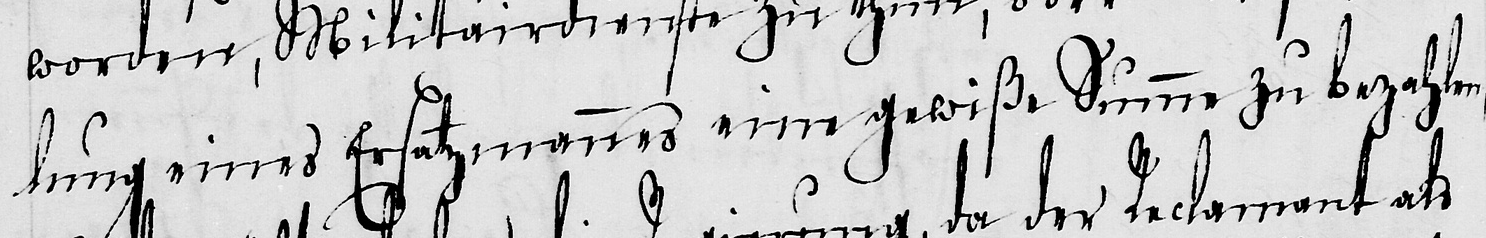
lung eines Ersatzmannes eine gewiße Summe zu bezahlen
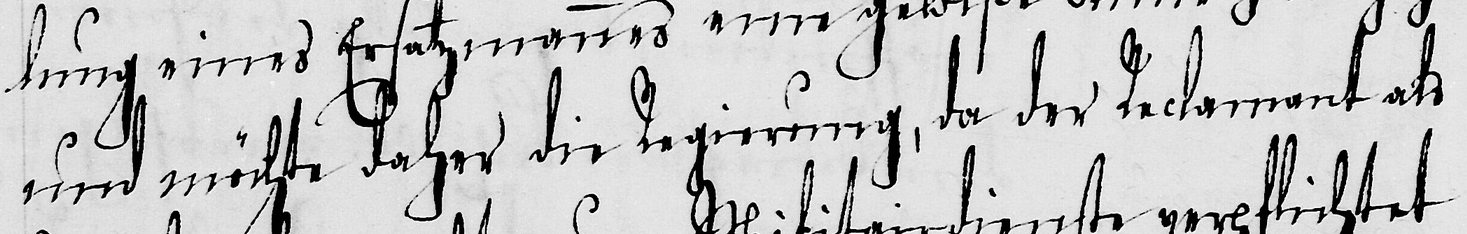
und möchte daher die Regierung, da der Reclamant als
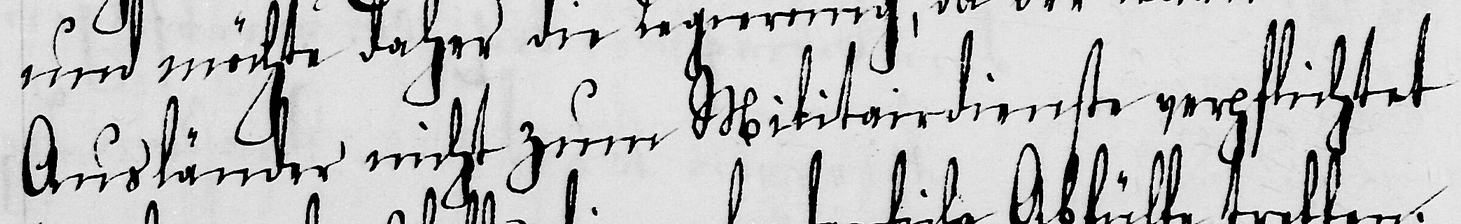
Ausländer nicht zum Militairdienste verpflichtet
